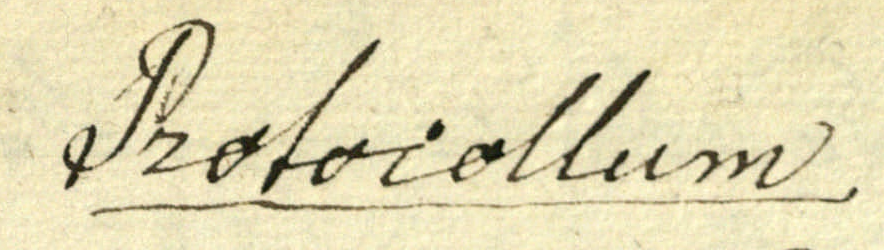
Protocollum
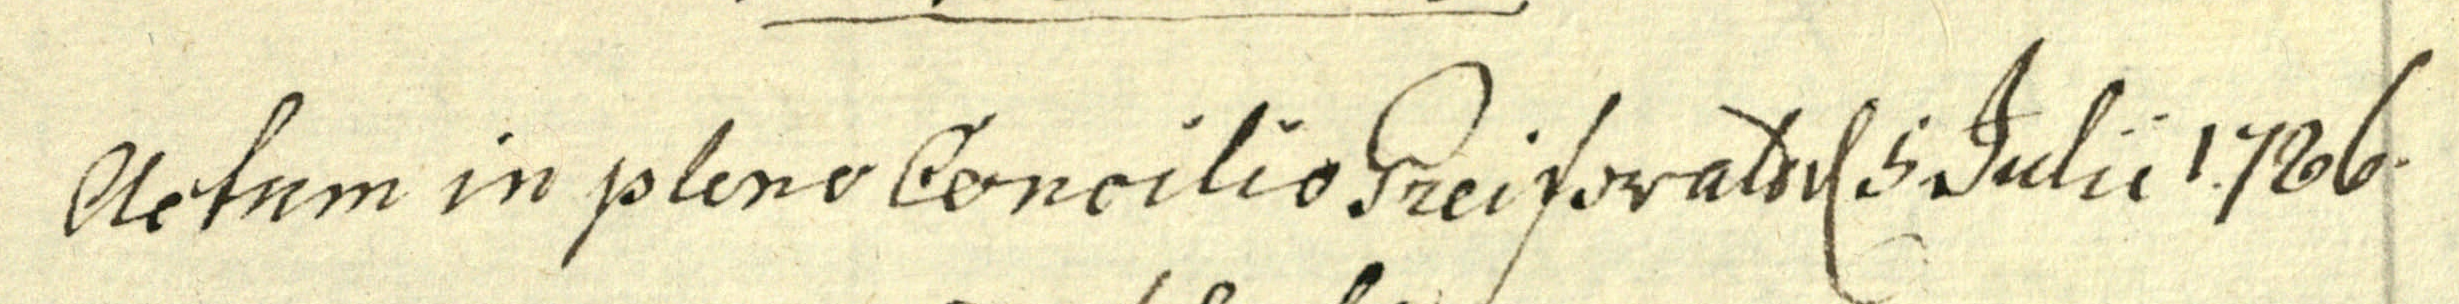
Actum in pleno Concilio Greifswald d 5. Julii 1786.
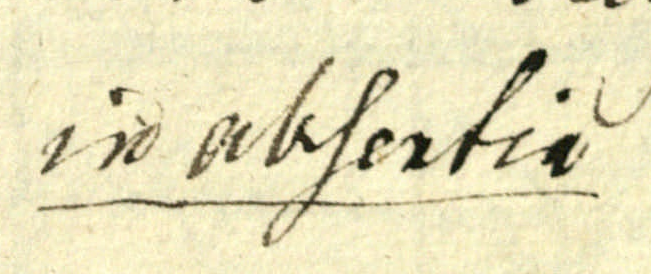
in absentia
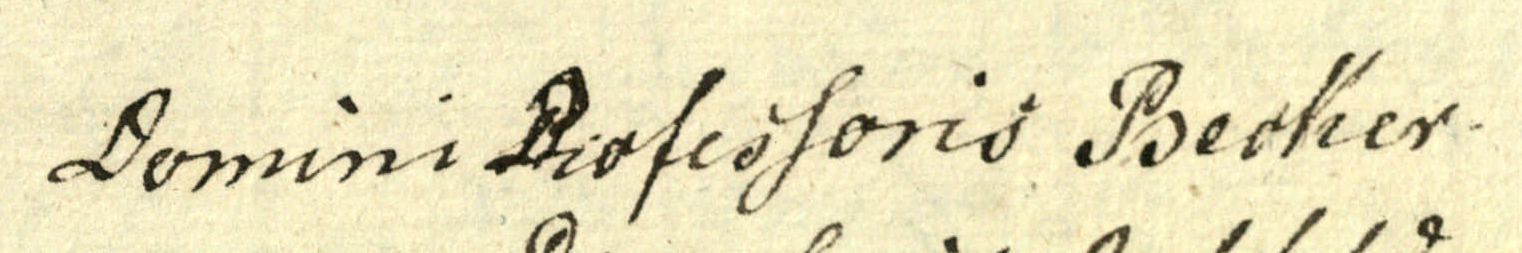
Domini Professoris Becker
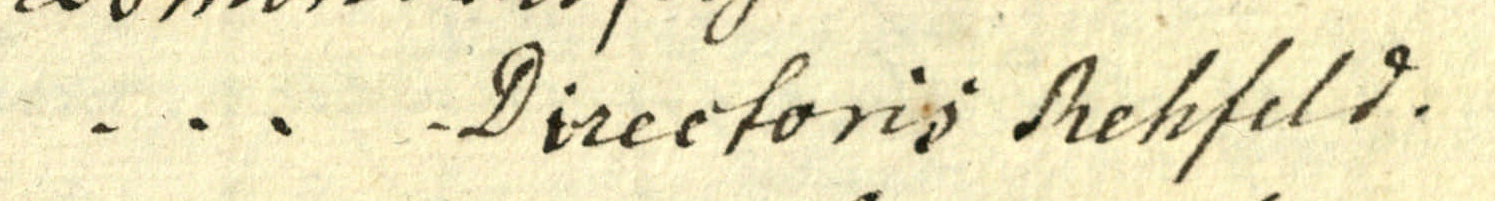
Directoris Rehfeld.
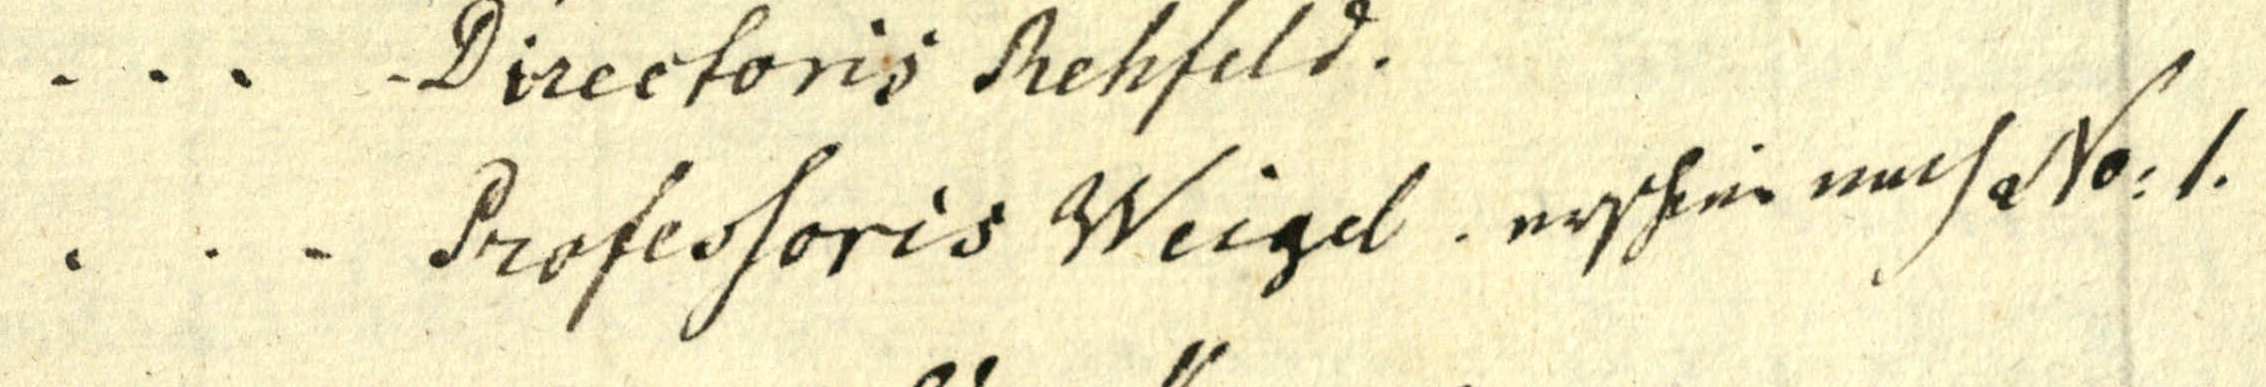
Professoris Weigel. erschien nach No. 1.
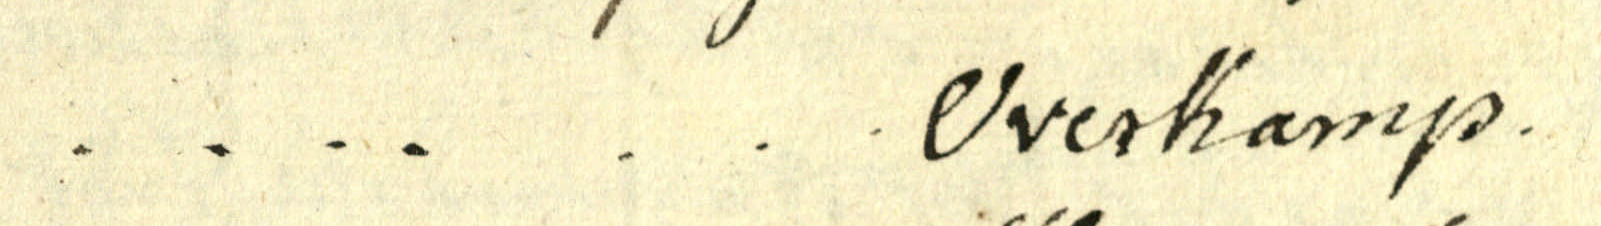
Overkamp.
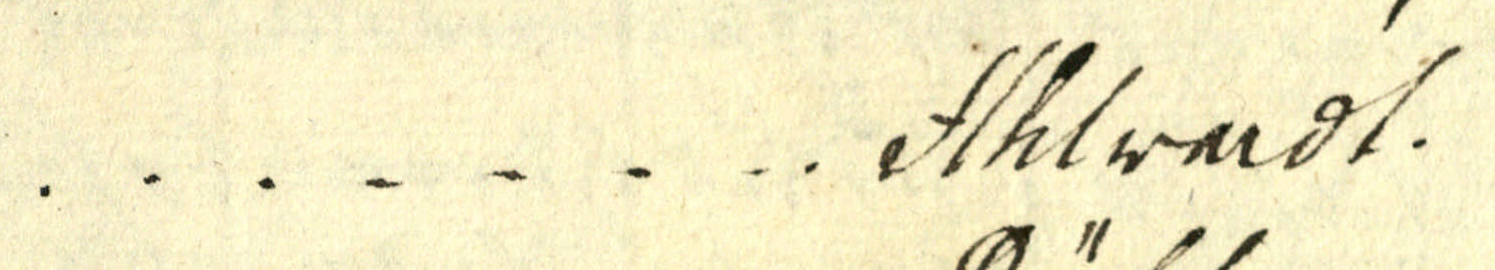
Ahlwardt.
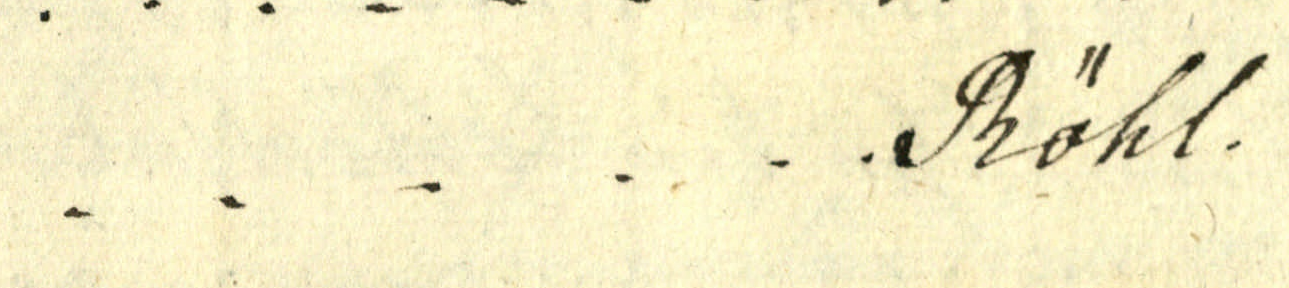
Röhl.
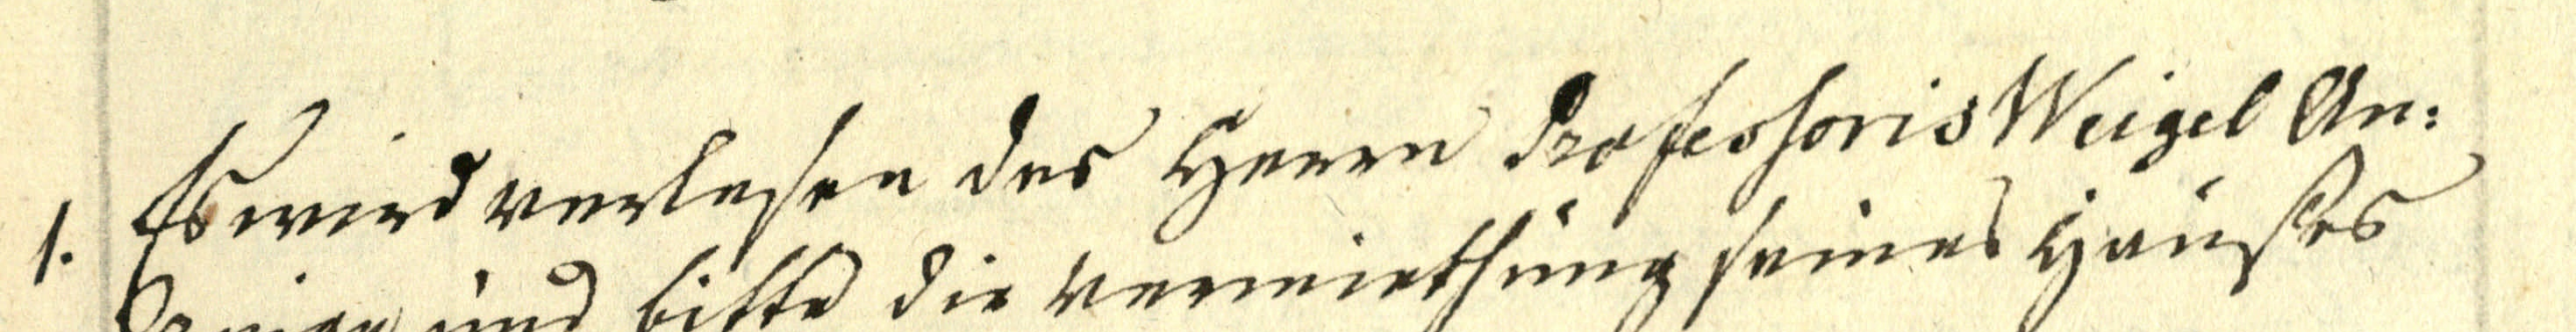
1. Es wird verlesen des Herrn Professoris Weigel An¬
